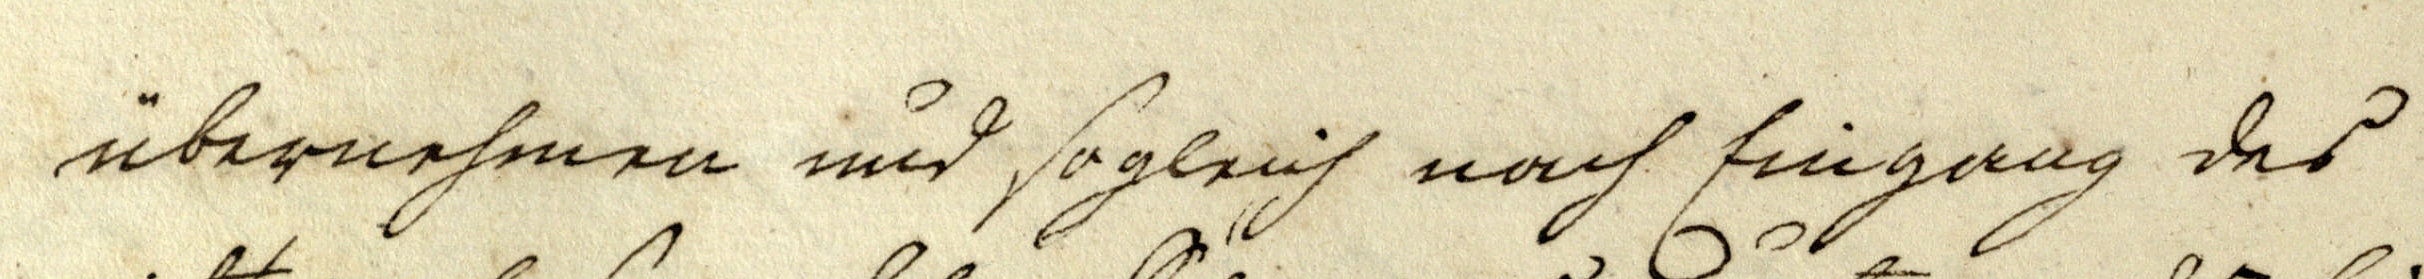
übernehmen und sogleich nach Eingang des
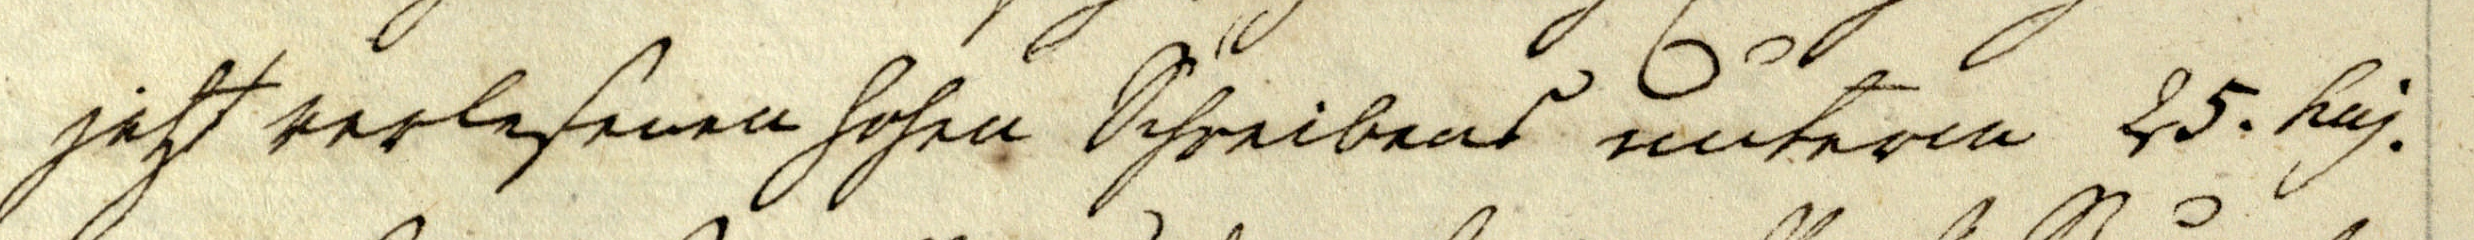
jetzt verlesenen hohen Schreibens unterm 25. huj.
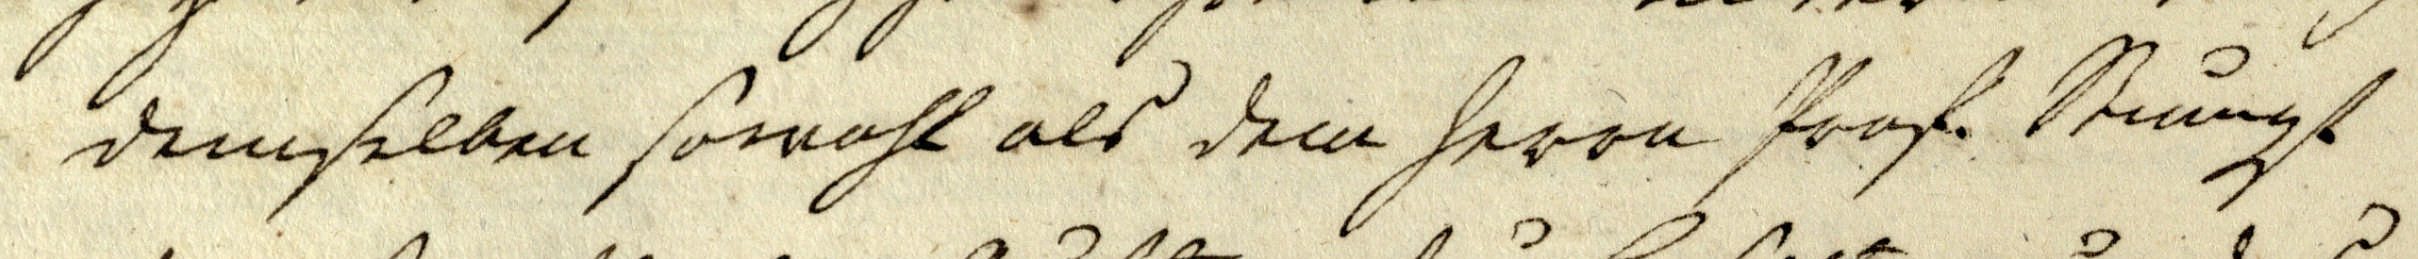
demselben sowohl als dem Herrn Prof. Stumpf
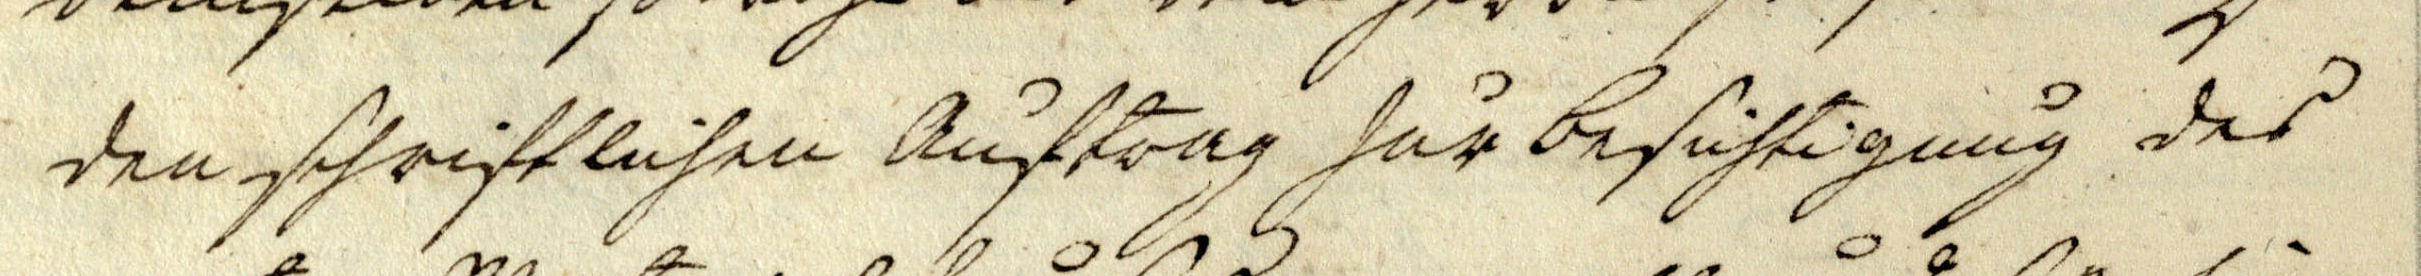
den schriftlichen Auftrag zur Besichtigung des
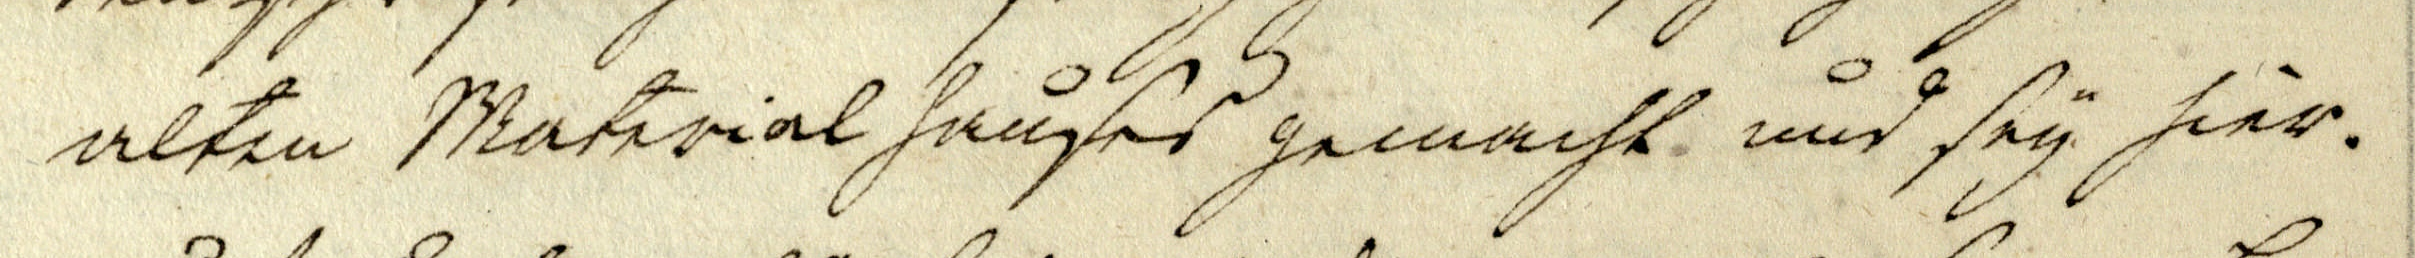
alten Material hauses gemacht und seÿ hier¬
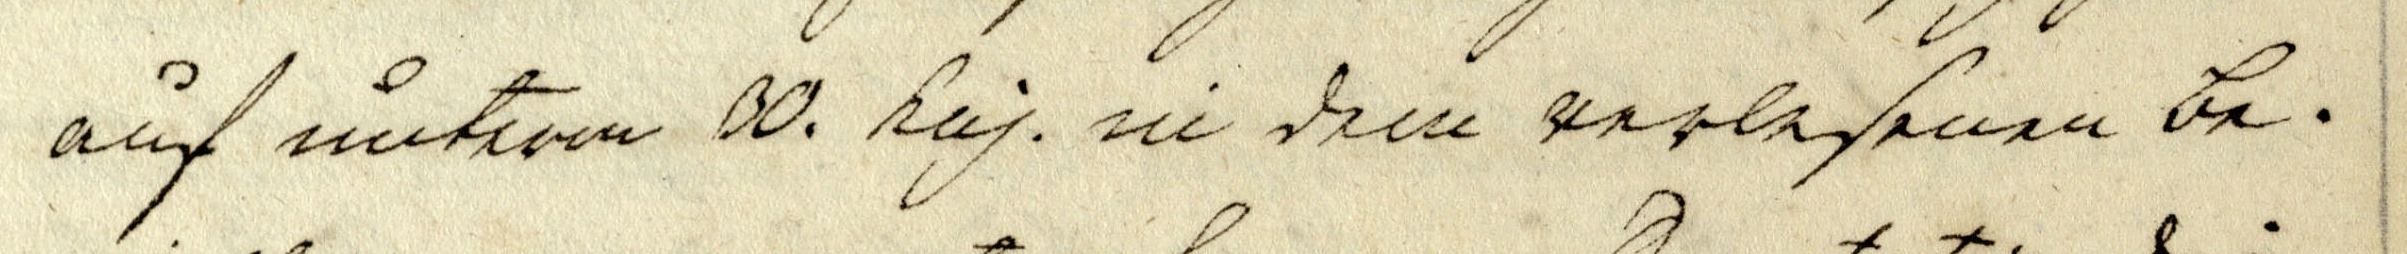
auf unterm 30. huj. in dem verlesenen Be¬
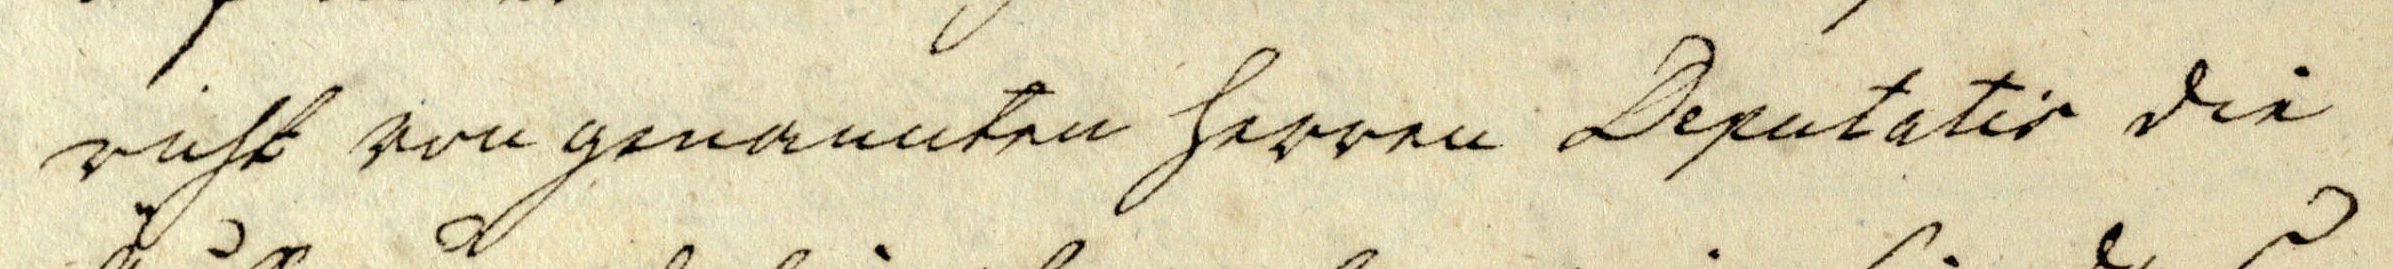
richt von genannten Herren Deputatis die
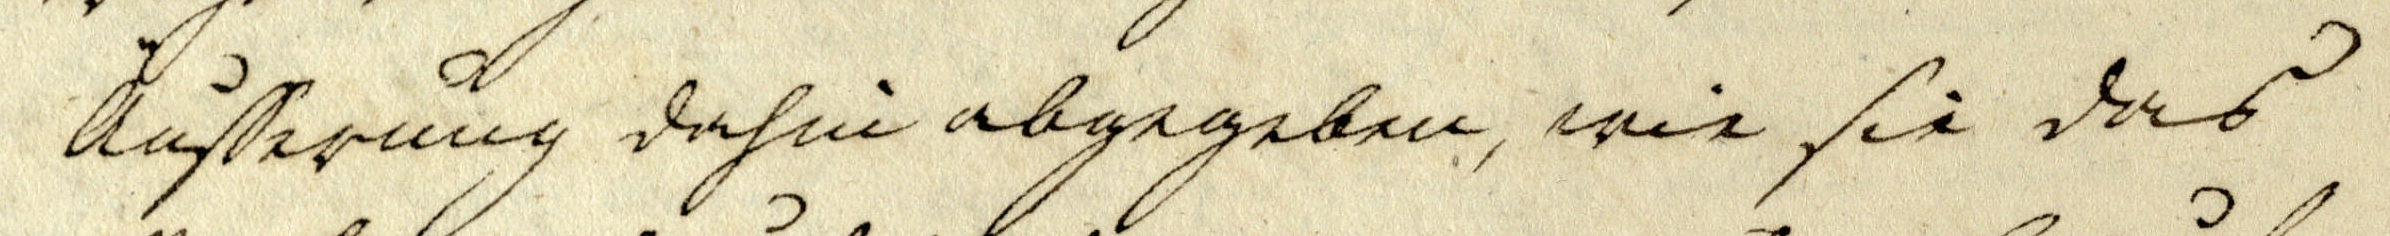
Äusserung dahin abgegeben, wie sie das
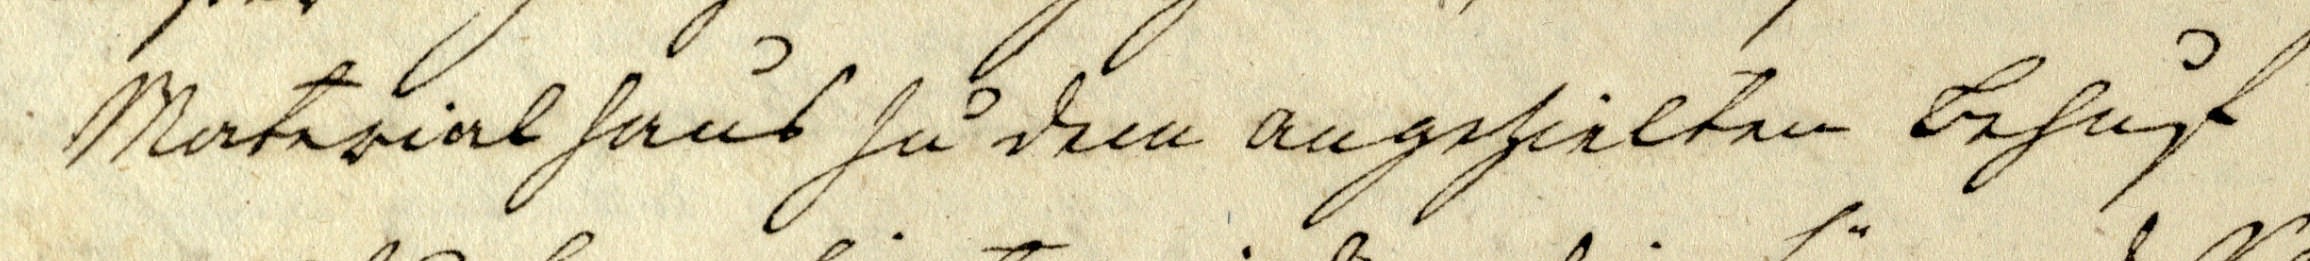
Materialhaus zu dem angezielten Behuf
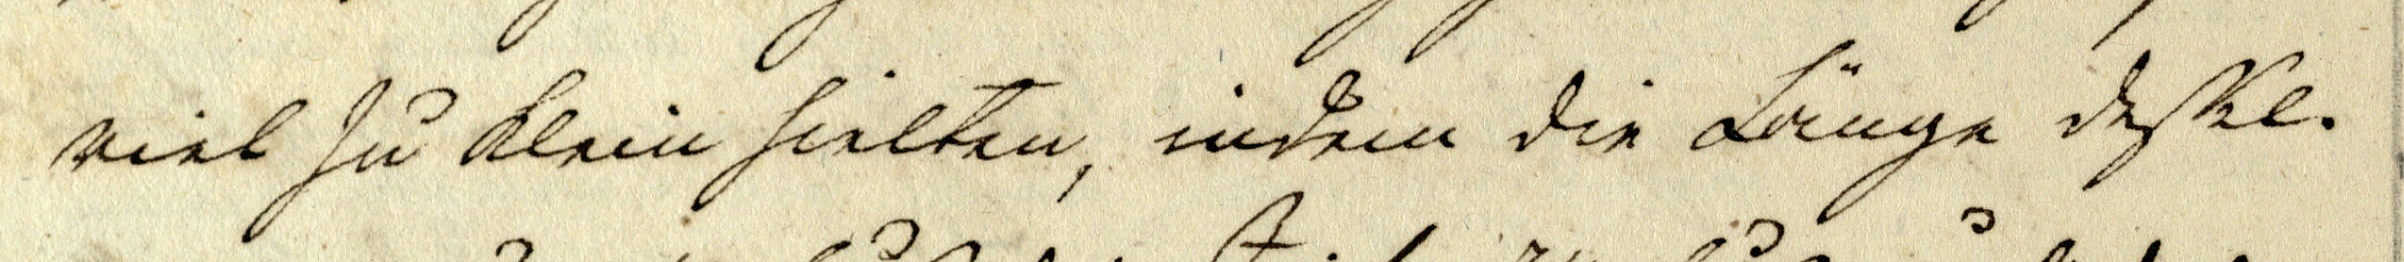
viel zu klein hielten, indem die Länge dessel¬
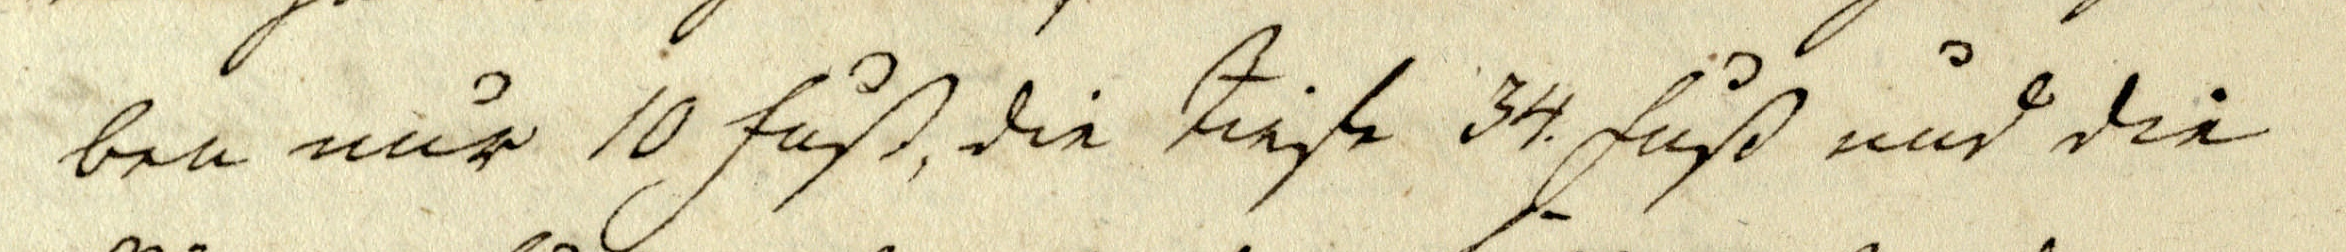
ben nur 10 Fuß, die Tiefe 34. Fuß und die
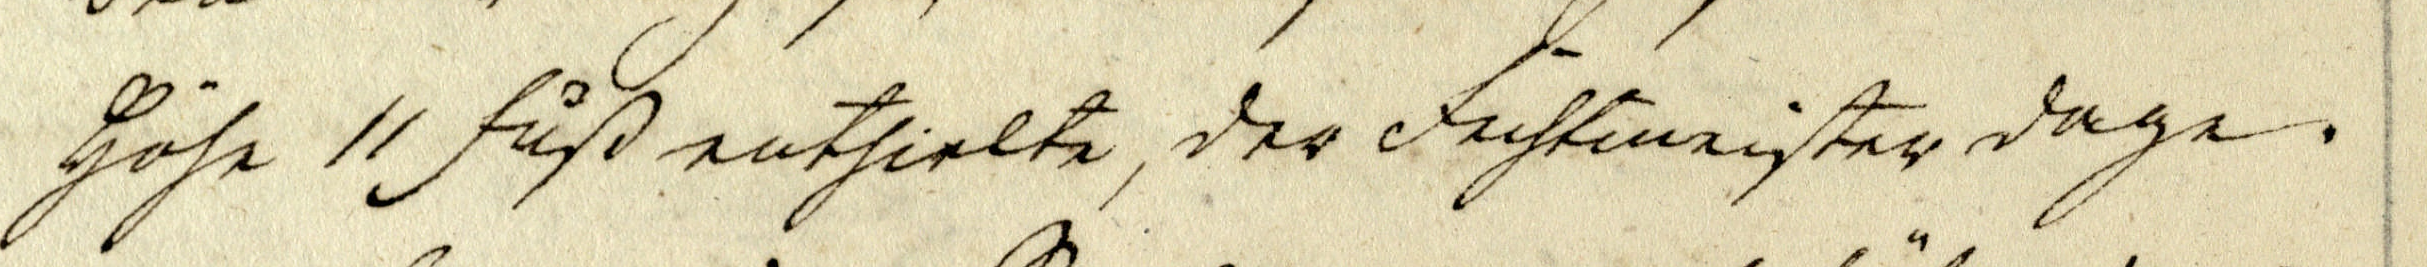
Höhe 11. Fuß enthielte, der Fechtmeister dage¬
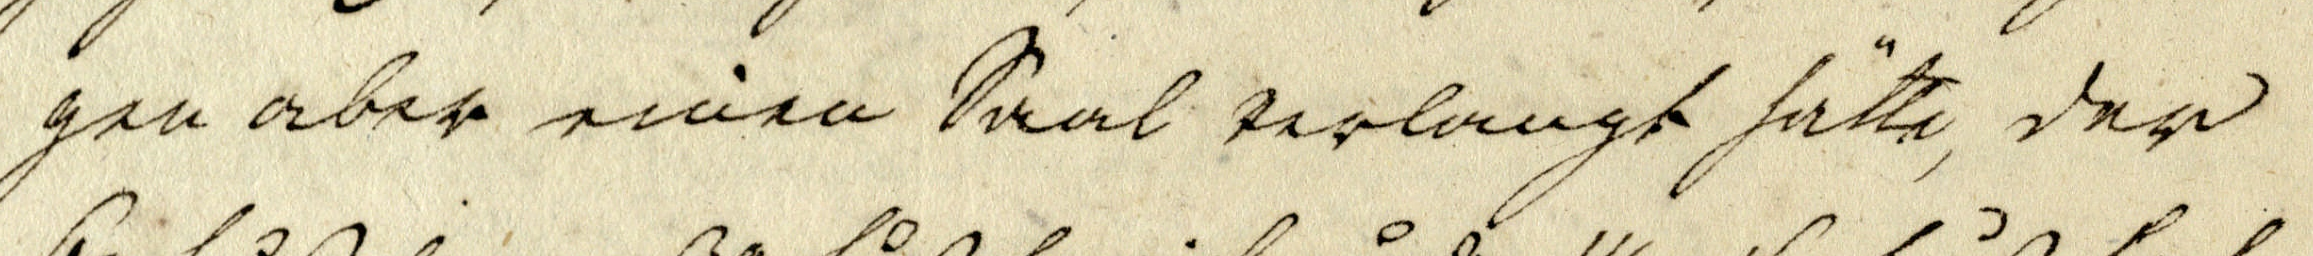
gen aber einen Saal verlangt hätte, der
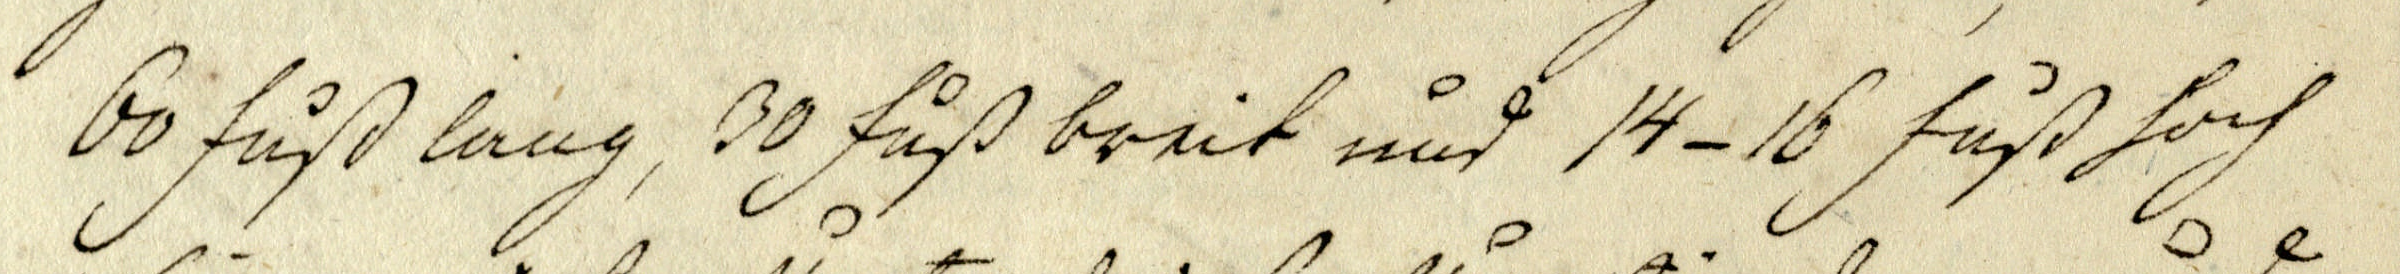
50 Fuß lang, 30 Fuß breit und 14-16 Fuß hoch
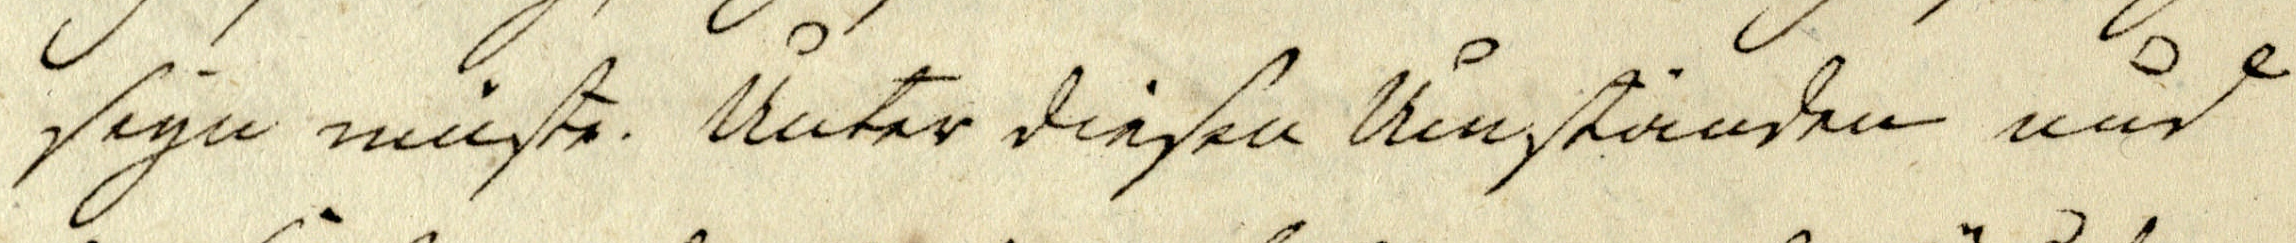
seÿn müßte. Unter diesen Umständen und
